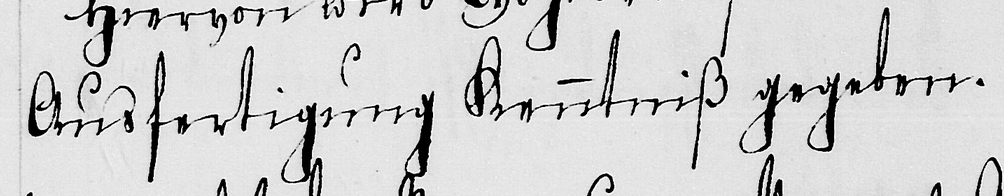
Ausfertigung Kenntniß gegeben.
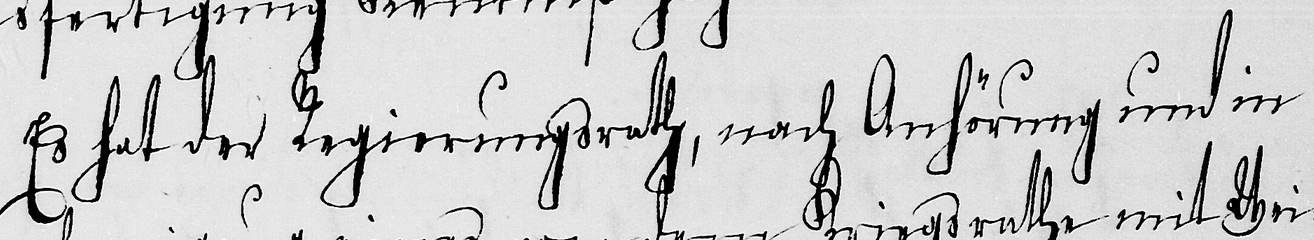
Es hat der Regierungsrath, nach Anhörung und in
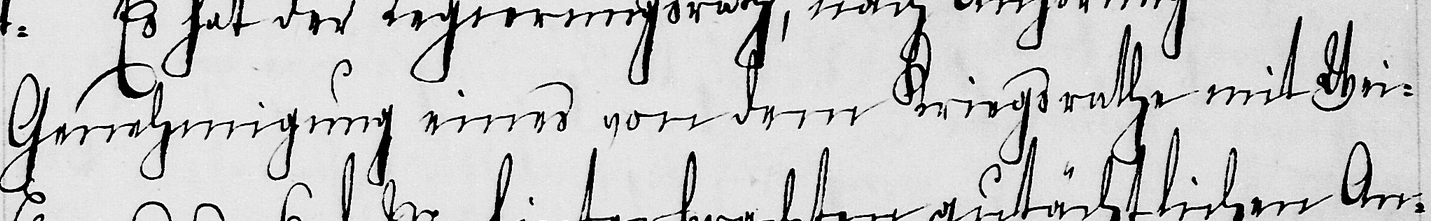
Genehmigung eines von dem Kriegsrathe mit Wei¬
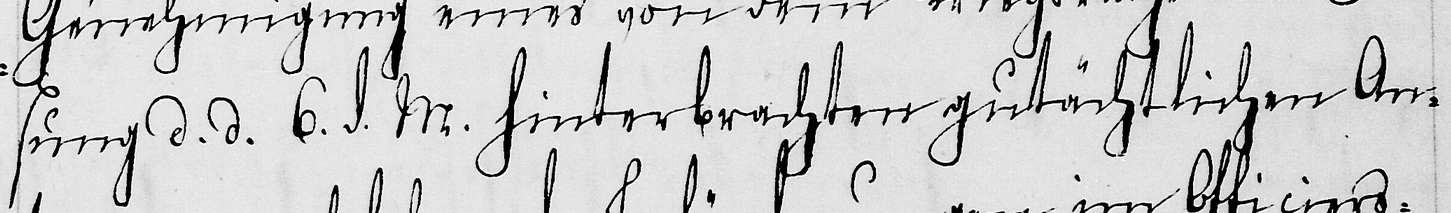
sung d. d. 6. d. M. hinterbrachten gutächtlichen An¬
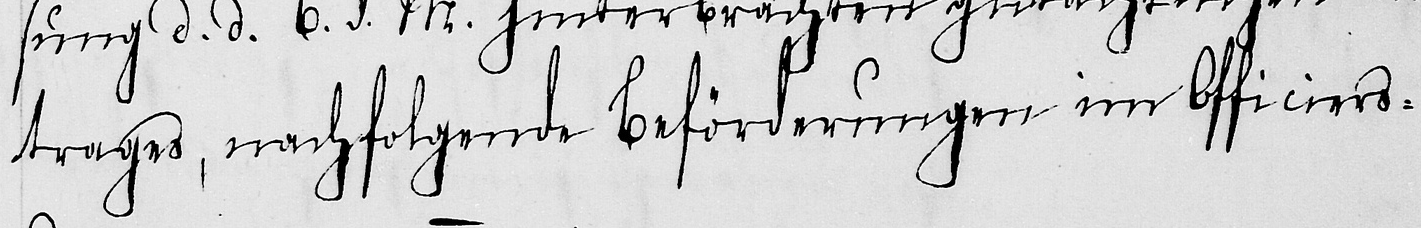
trages, nachfolgende Beförderungen im Officier¬
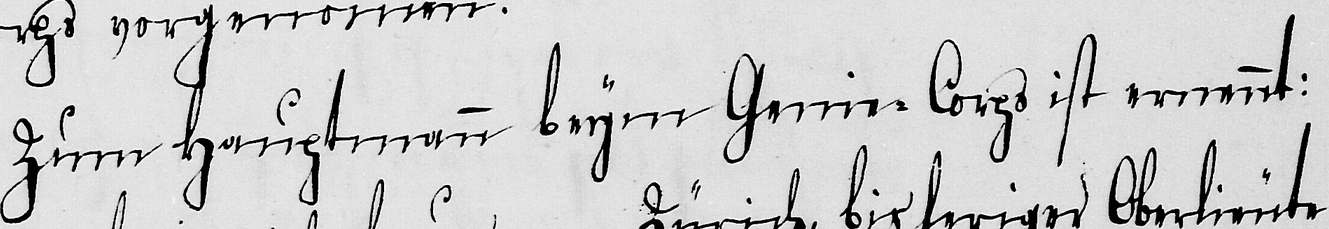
Zum Hauptmann beym Genie-Corps ist ernannt:
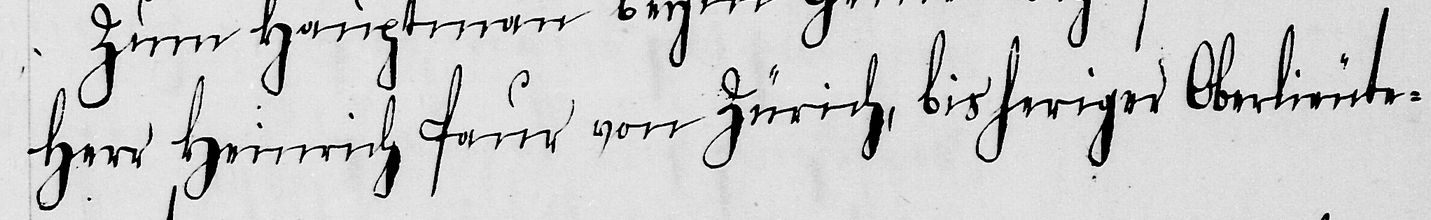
Herr Heinrich Paur von Zürich, bisheriger Oberstlieut¬
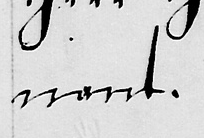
enant.
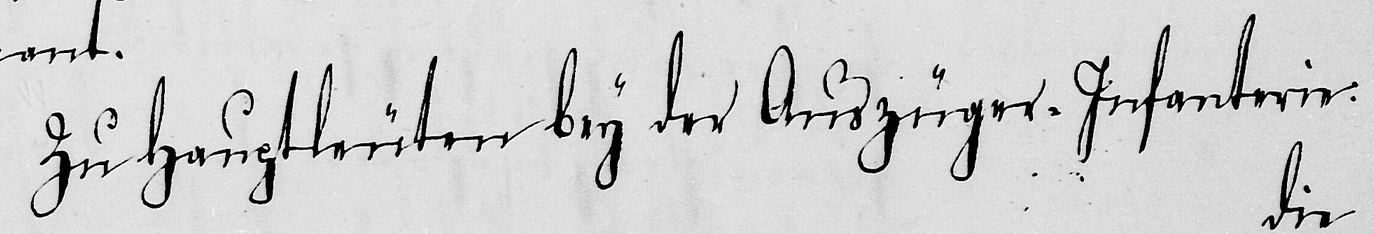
Zu Hauptleuten bey der Auszüger-Infanterie:
